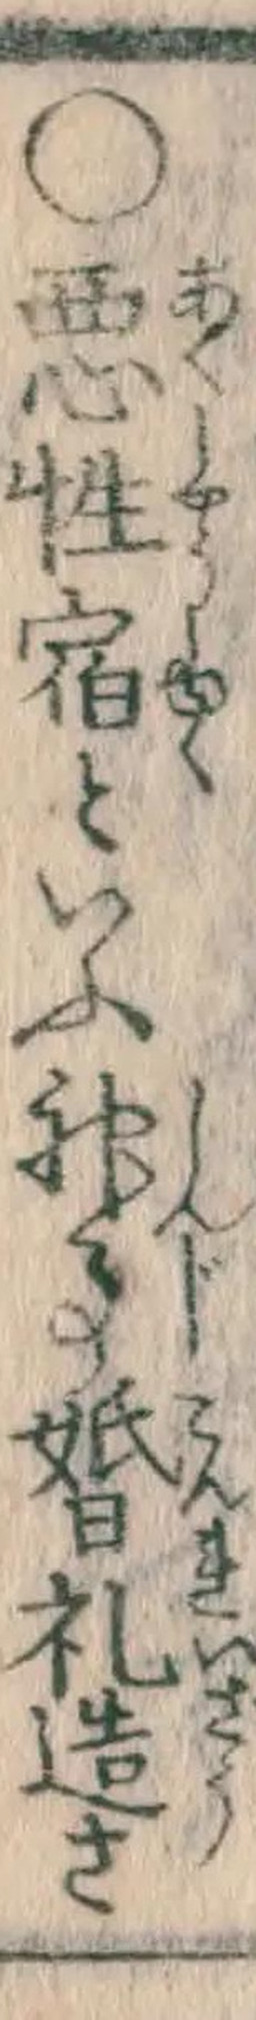○悪性宿といふ神事婚礼造さ
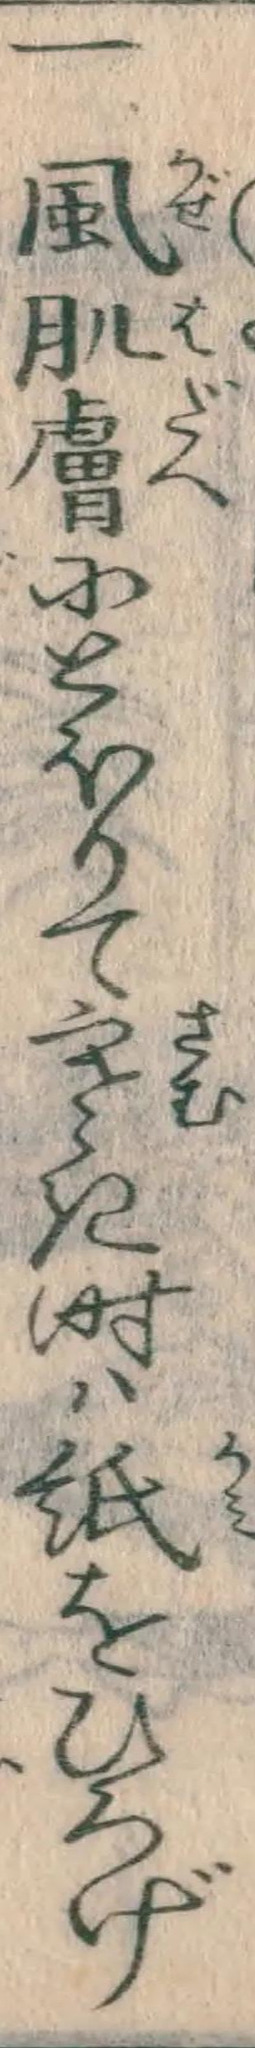一風肌膚にとほりて寒き時は紙をひろげ
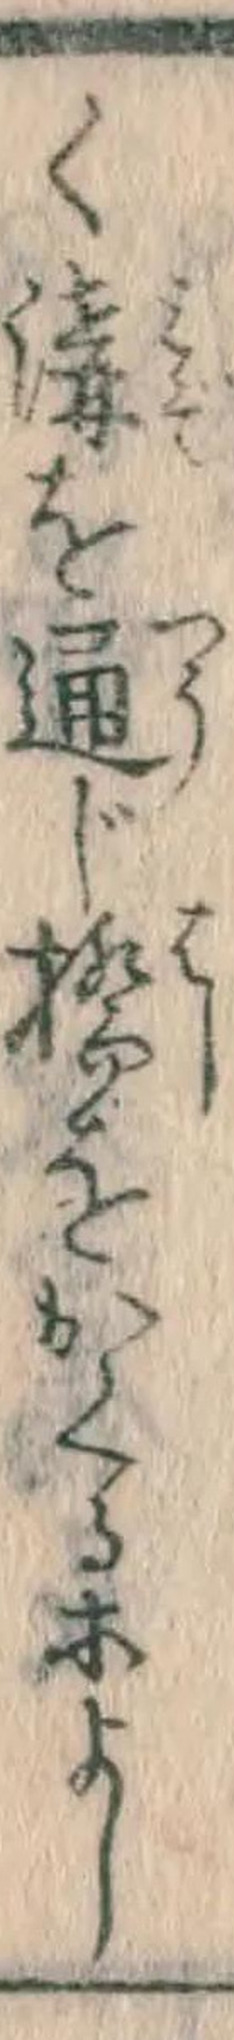く溝を通じ橋をかくる等よし
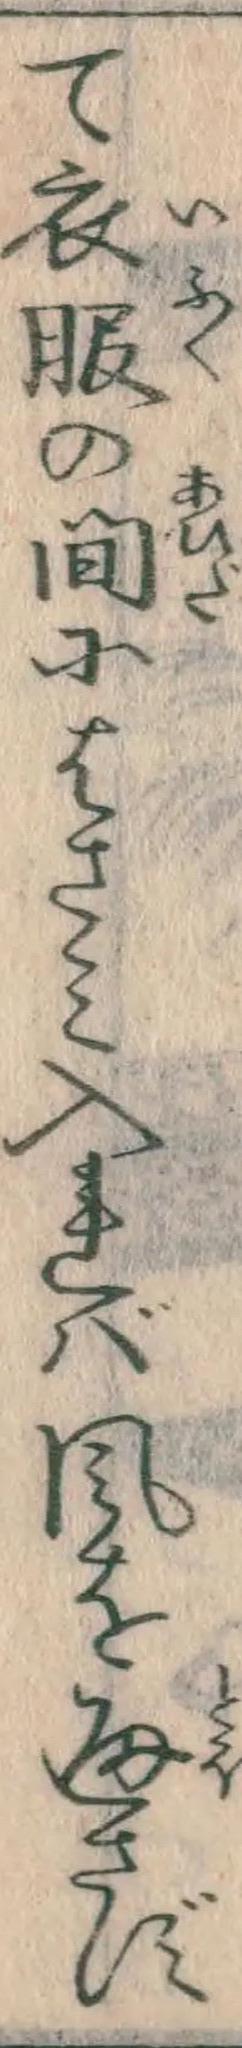て衣服の間にはさみ入れば風を通さず
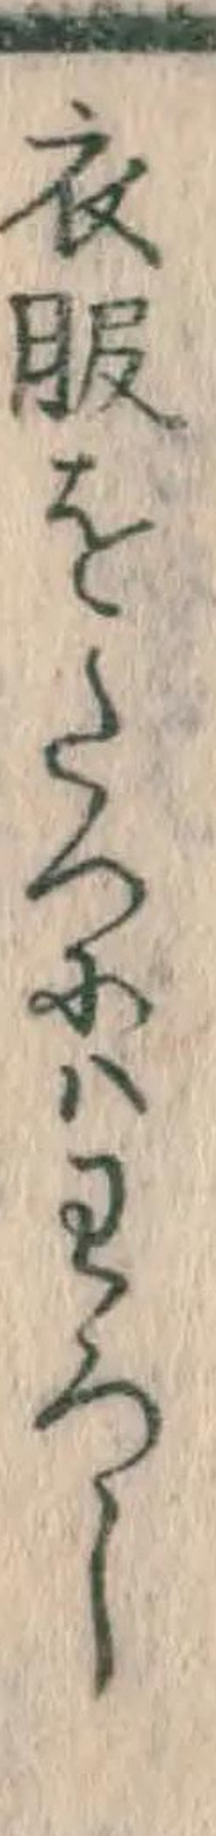衣服をたつにはわろし
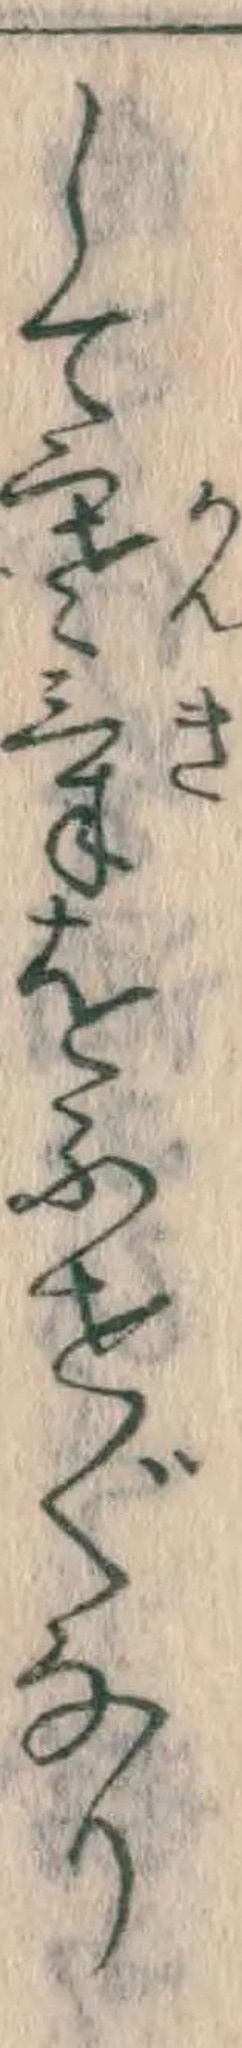して寒気をふせぐなり
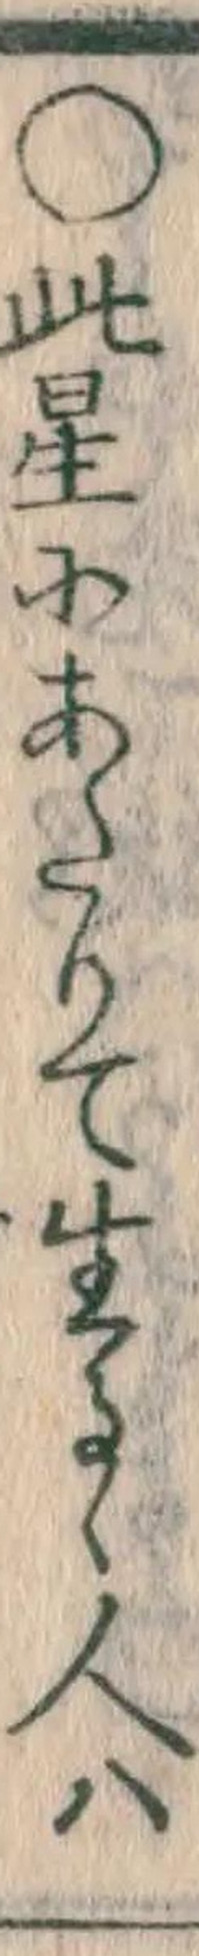○此星にあたりて生るゝ人は
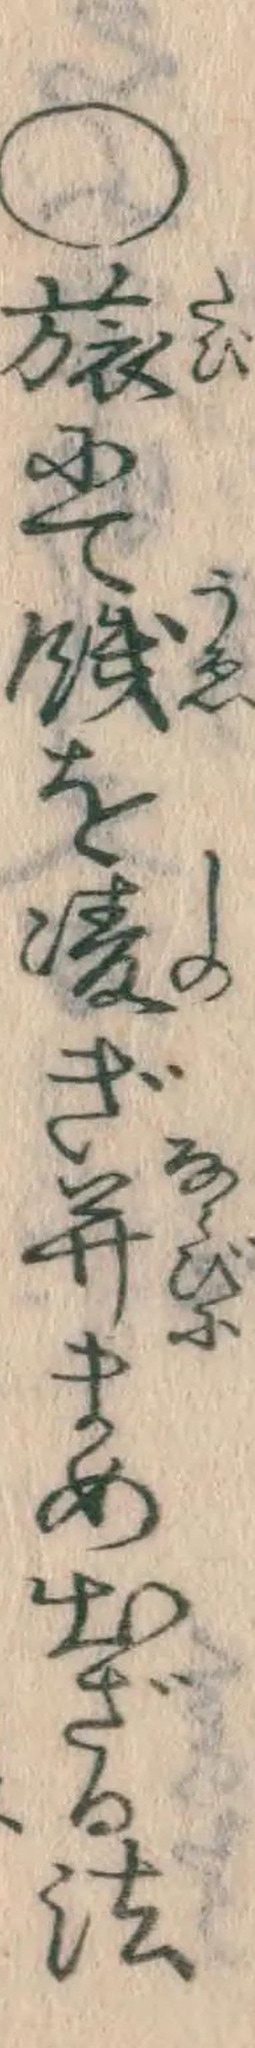○旅にて饑を凌ぎ并まめ出ざる法
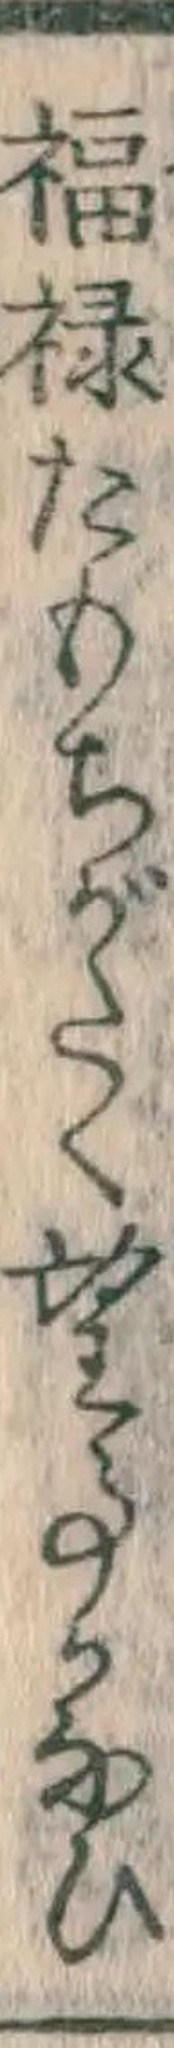福禄たもちがたく望事かなひ
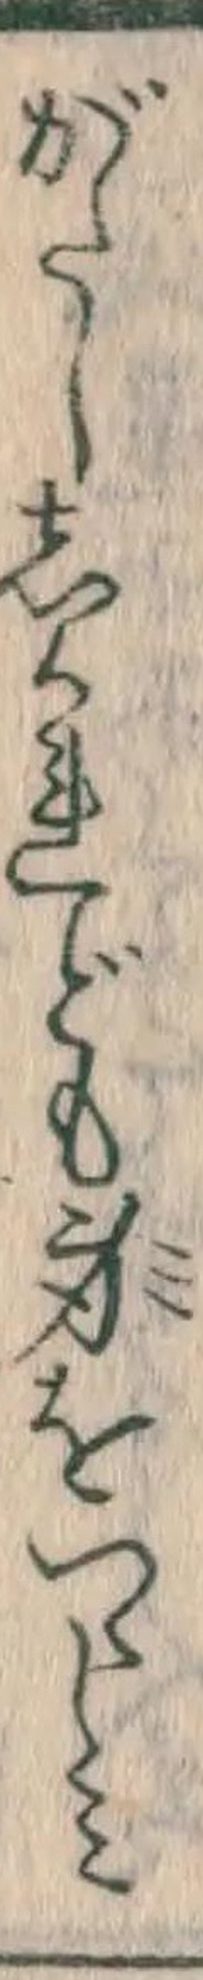がたししかれども身をつゝしみ
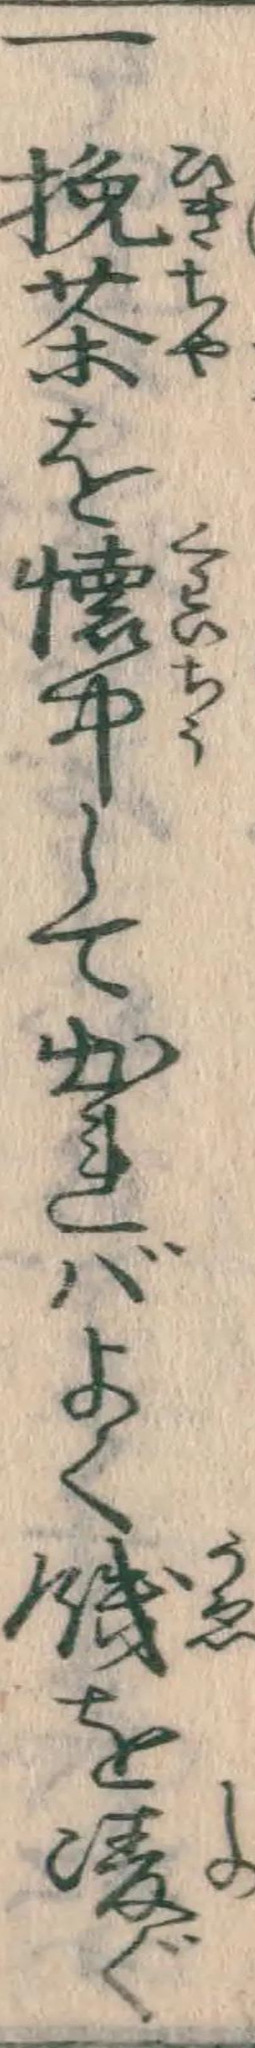一挽茶を懐中して出ればよく饑を凌ぐ
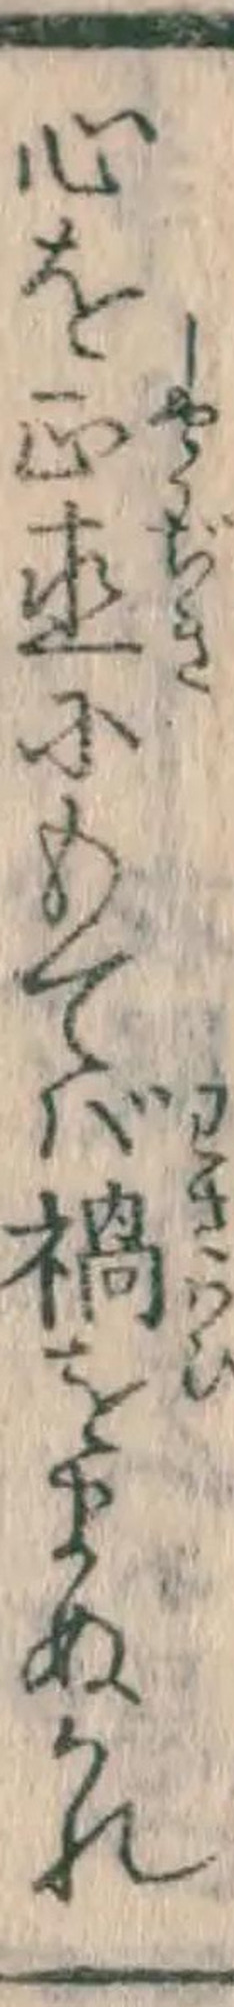心を正直にもてば禍をまぬかれ
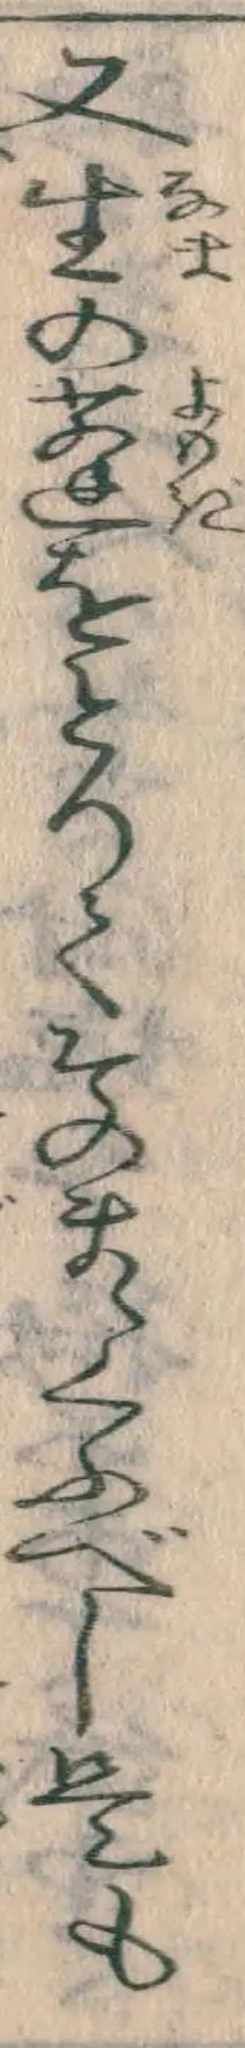又生の蓬をとりてそのまゝくふべし是も
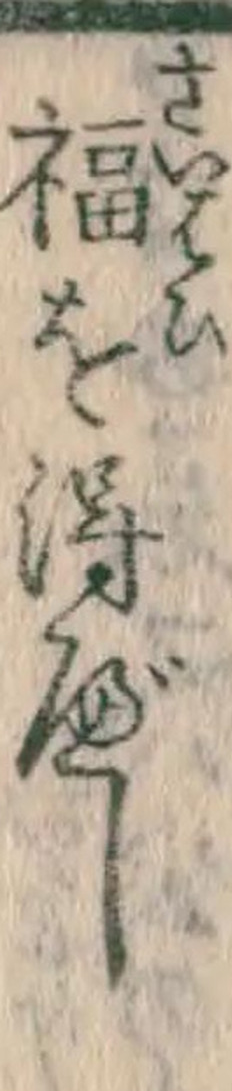福を得べし
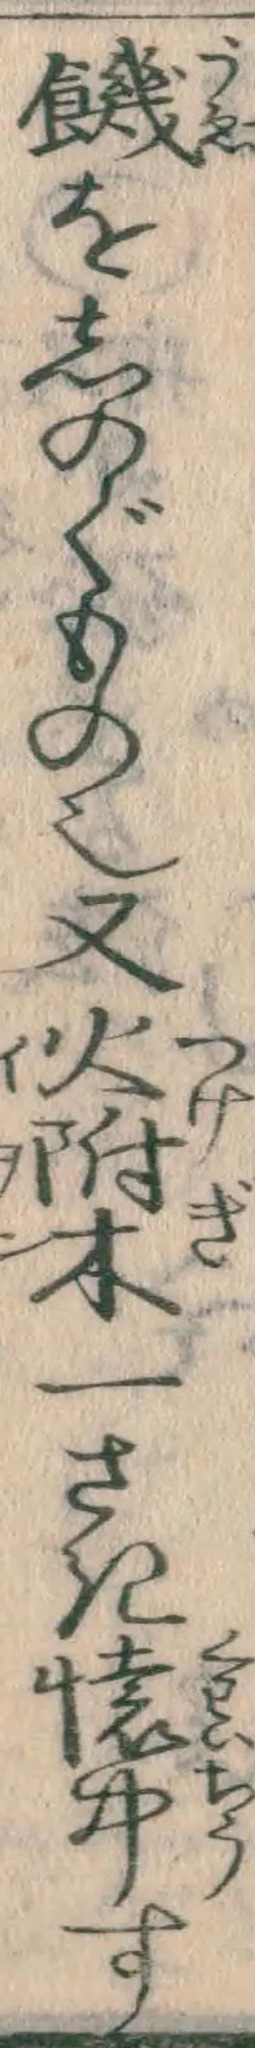饑をしのぐもの也又火附木一さき懐中す
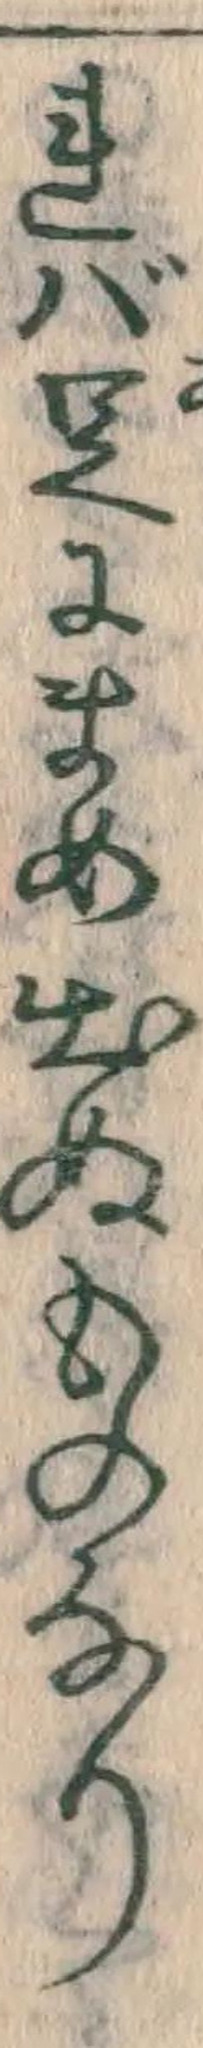れば足にまめ出ぬものなり
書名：広益秘事大全 3巻. [2]
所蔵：国立国会図書館 National Diet Library, JAPAN
